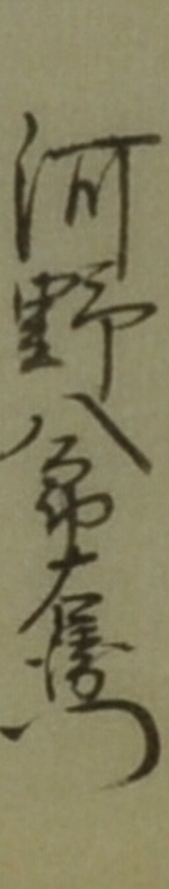河野八郎右衛門
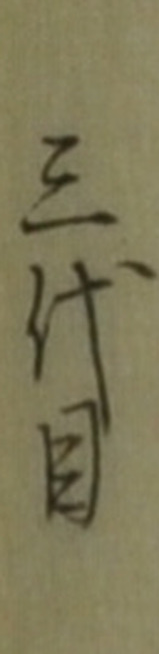三代目
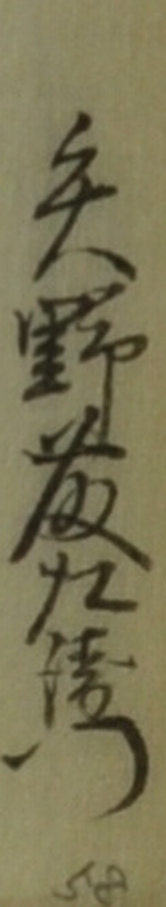矢野藤左衛門
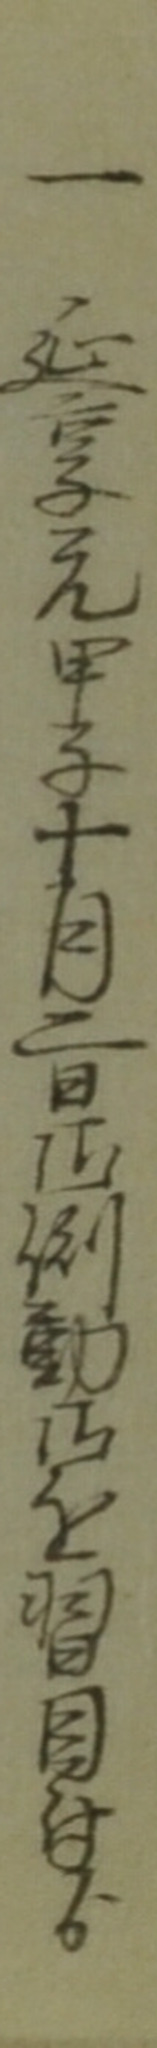一延享元甲子十月二日御側勤御世習目付ゟ
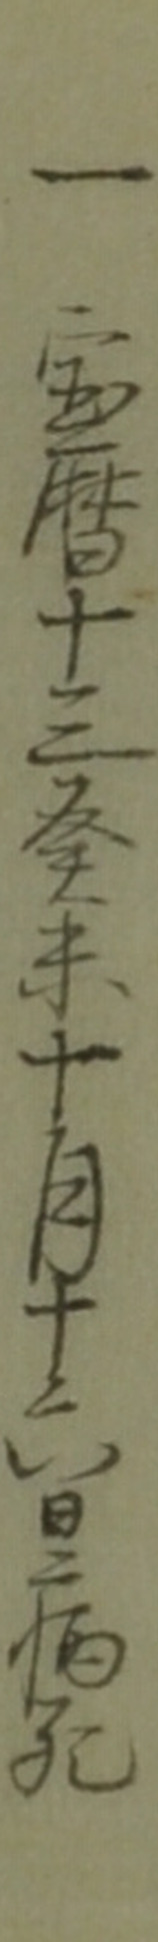一宝暦十三癸未十月十六日病死
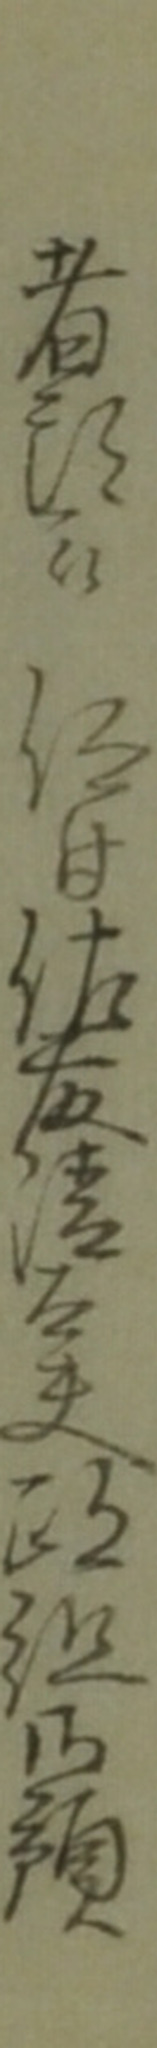者頭被仰付佐藤清太夫跡組御預
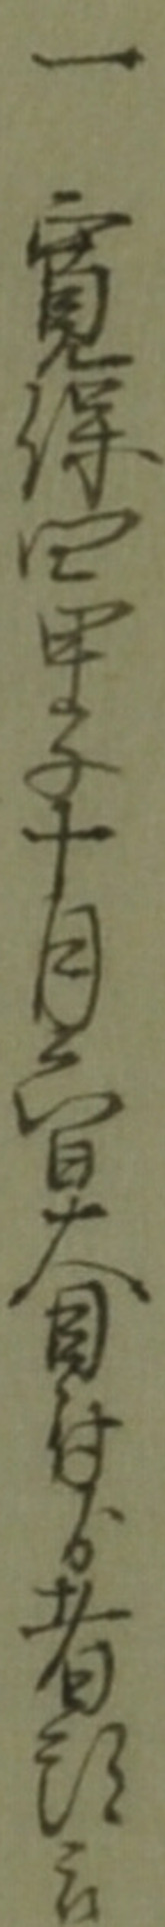一寛保四甲子十月六日大目付ゟ者頭被
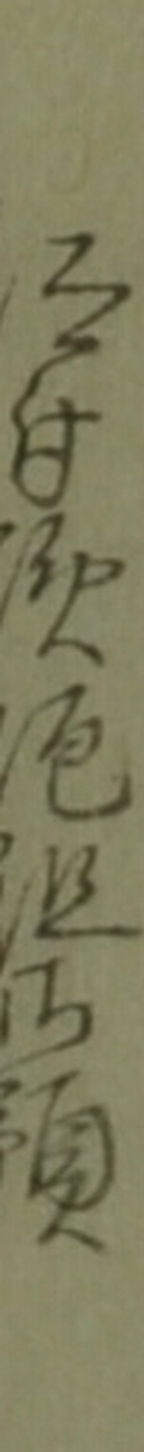仰付鉄砲組御預
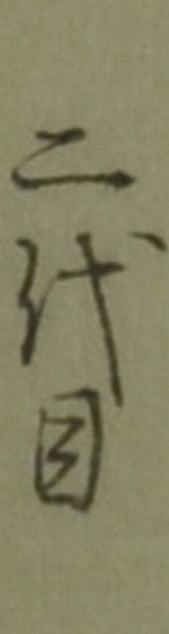二代目
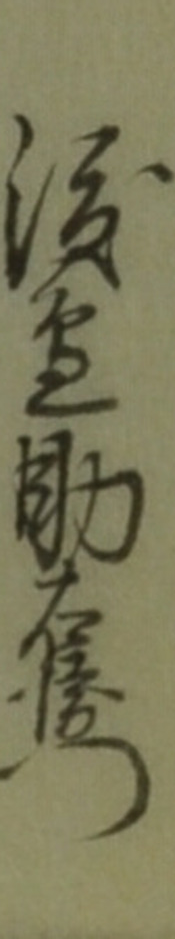渡辺助右衛門
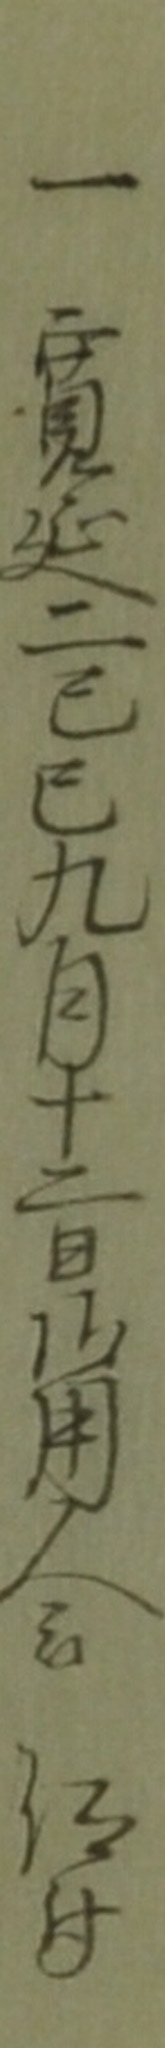一寛延二己巳九月十二日御用人被仰付
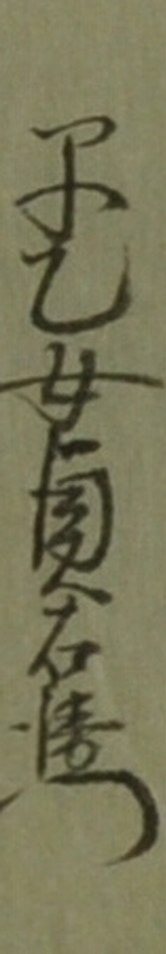早乙女貞右衛門
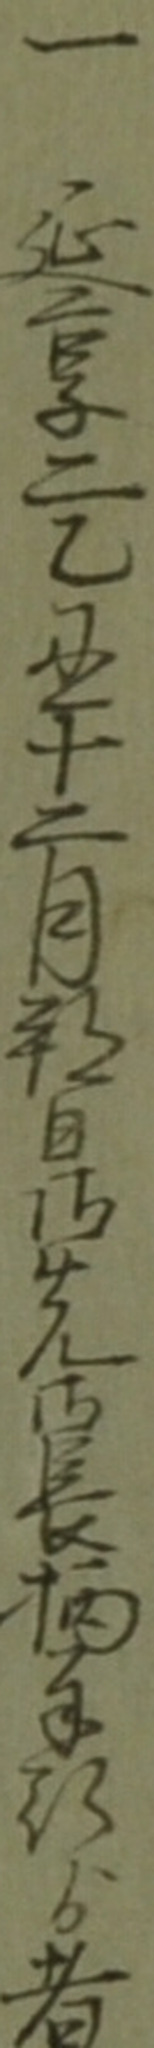一延享二乙丑十二月朔日御先御長柄奉行ゟ者頭
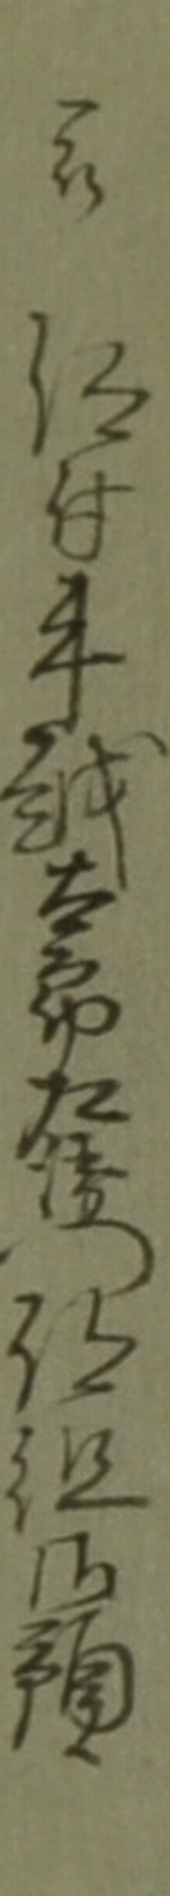被仰付牛越太郎左衛門跡組御預

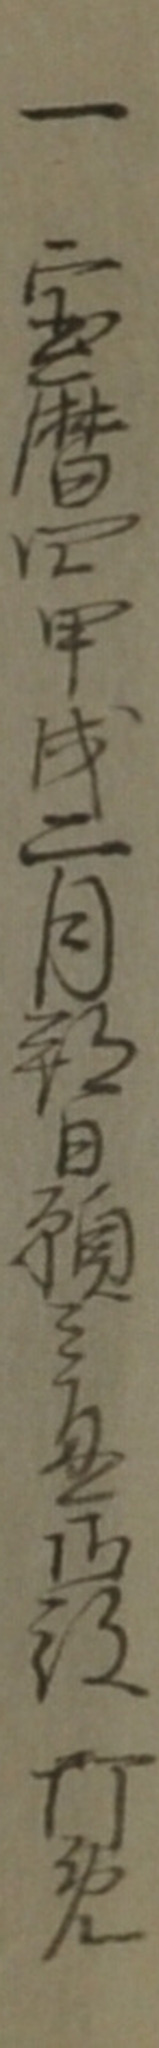一宝暦四月甲戌二月朔日願之通御役御免
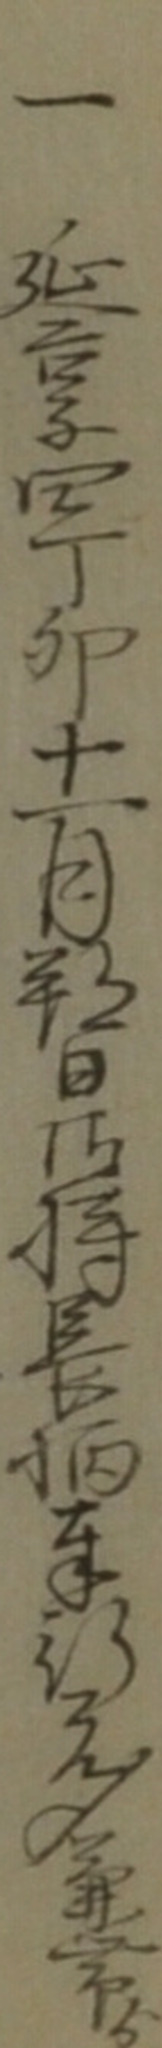一延享四丁卯十一月朔日御持長柄奉行元〆兼帯ゟ
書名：諸御役代々録（二）
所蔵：伊那市立高遠町図書館・合同会社AMANE
